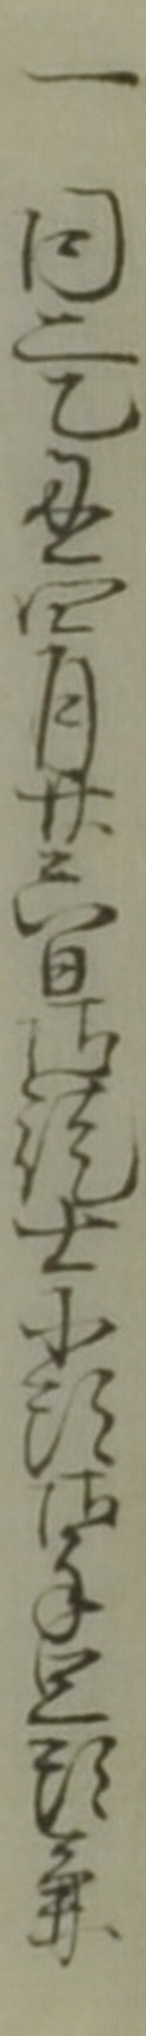一同二乙丑四月廿六日御徒士小頭御手廻頭兼
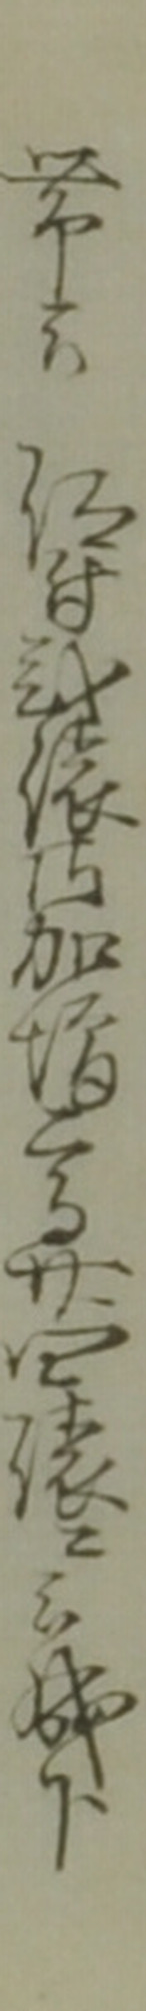帯被仰付弐俵御加増高廿四俵ニ被成下
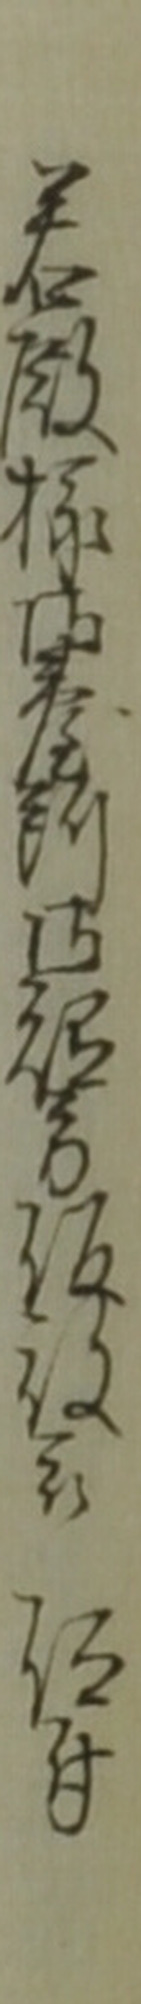若殿様御台所御賄方仮役被仰付
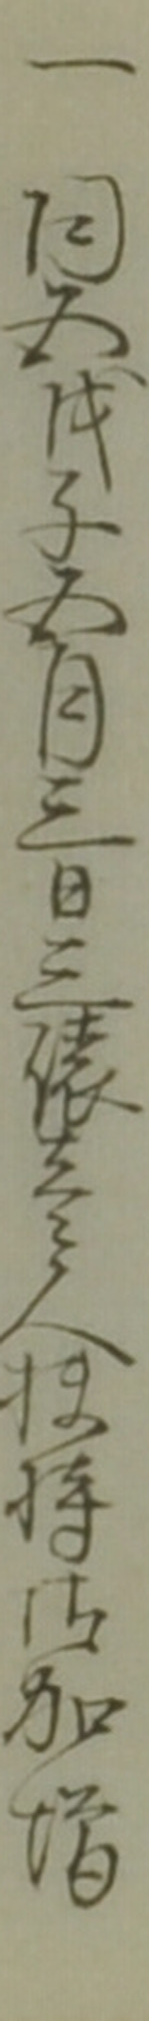一同五戌子五月三日三俵壱人扶持御加増
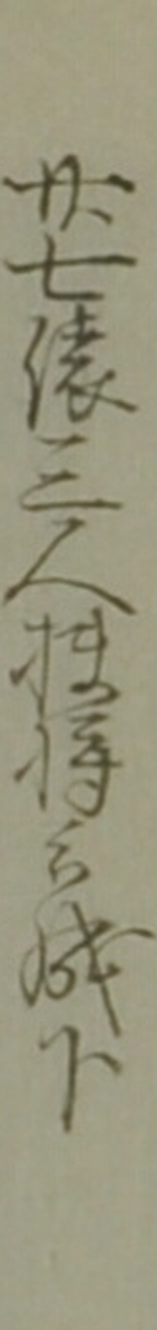廿七俵三人扶持被成下
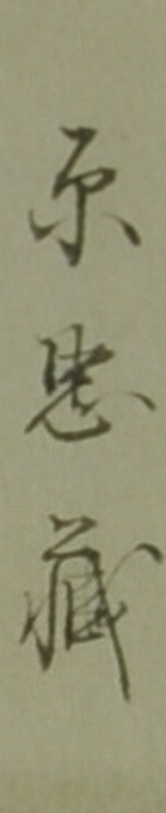原忠蔵

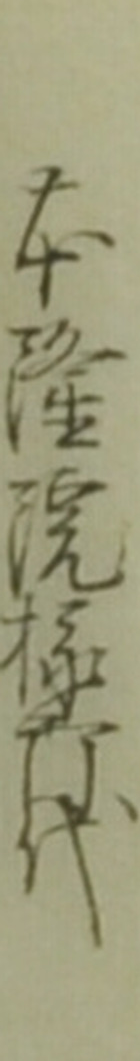本隆院様御代
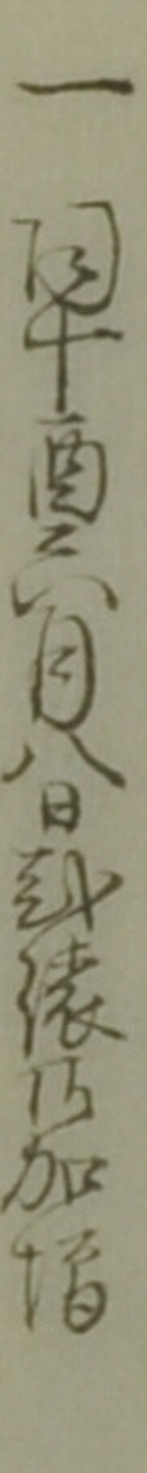一同十酉六月八日弐俵御加増
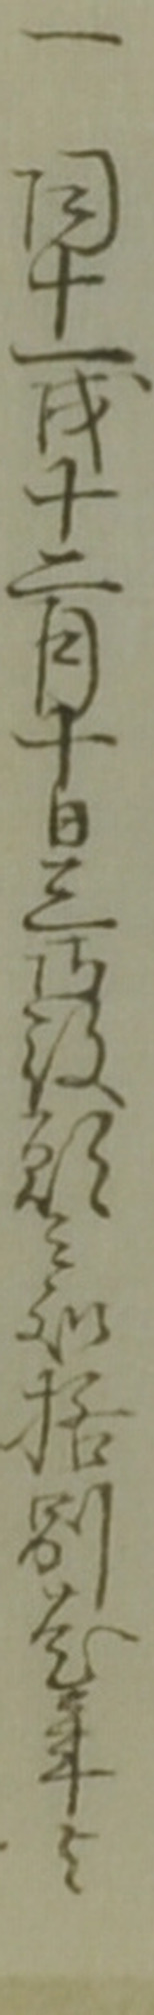一同十一戌十二月十日三御役願之処格別老年与
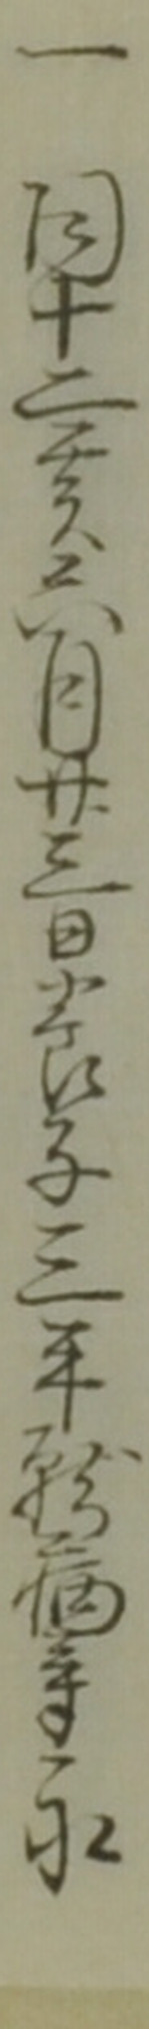一同十二亥六月廿三日養子三平就病気永
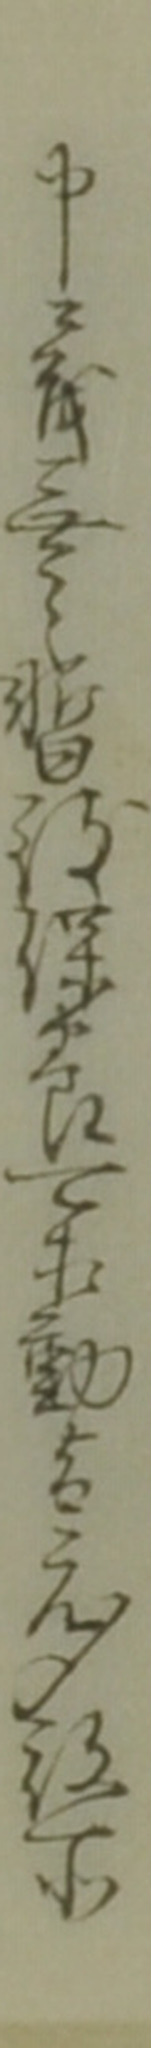申ニ茂無之暫致保養加可相勤旨元〆役所
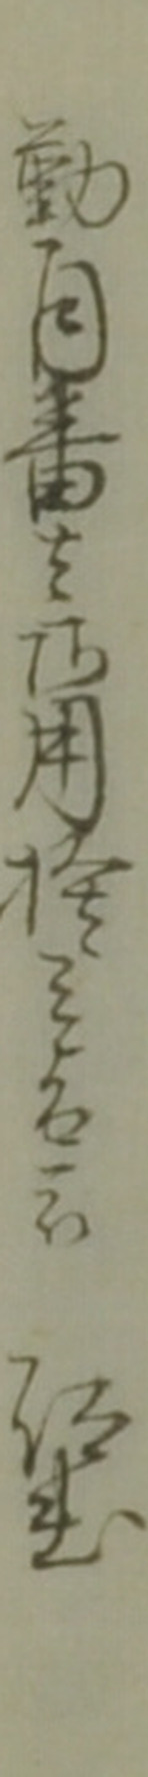勤月番者御用捨之旨被仰出
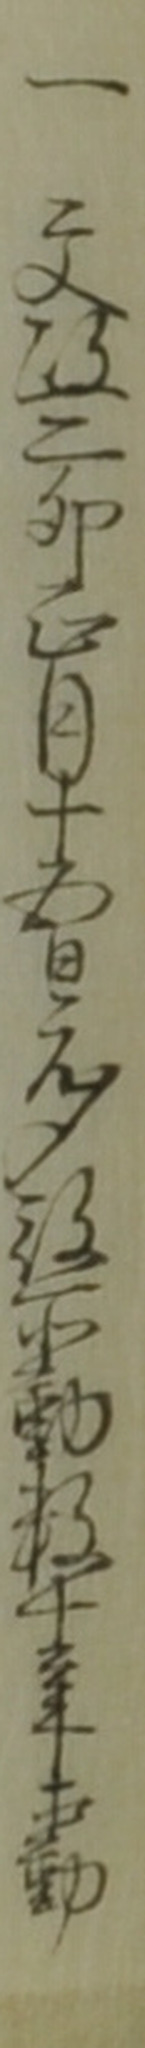一文政二卯正月十五日元〆役所数十年相勤
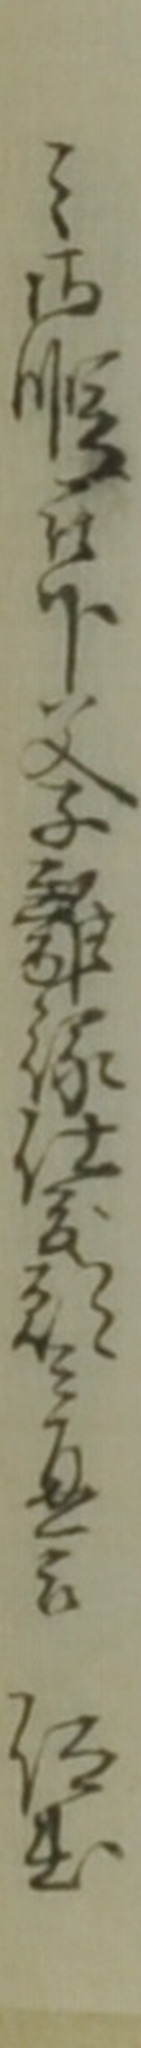之御暇被下父子離縁仕度願之通被仰出
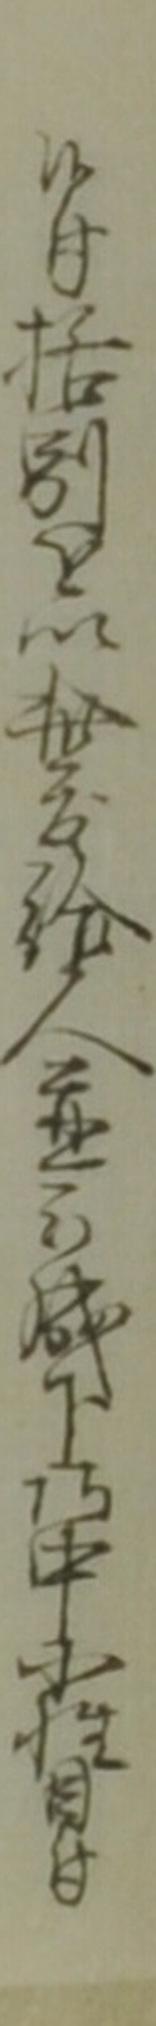候付格別を以此度給人並被成下御中小性目付
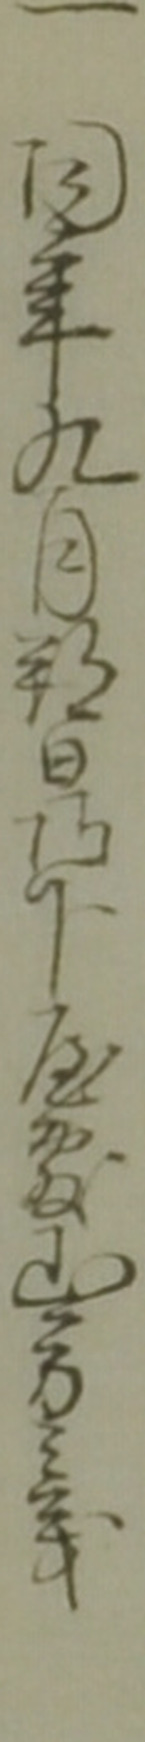一同年九月朔日御下屋敷山方之義
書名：無足諸士勤仕録（一）
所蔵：伊那市立高遠町図書館・合同会社AMANE
